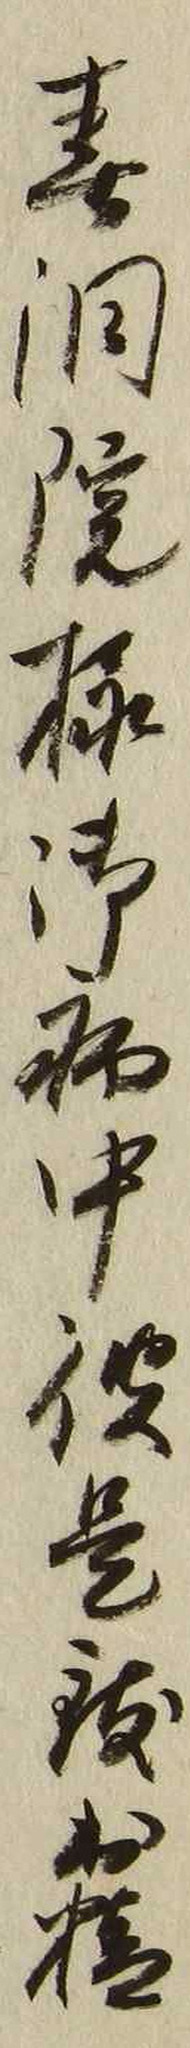春洞院様御病中彼是致出精
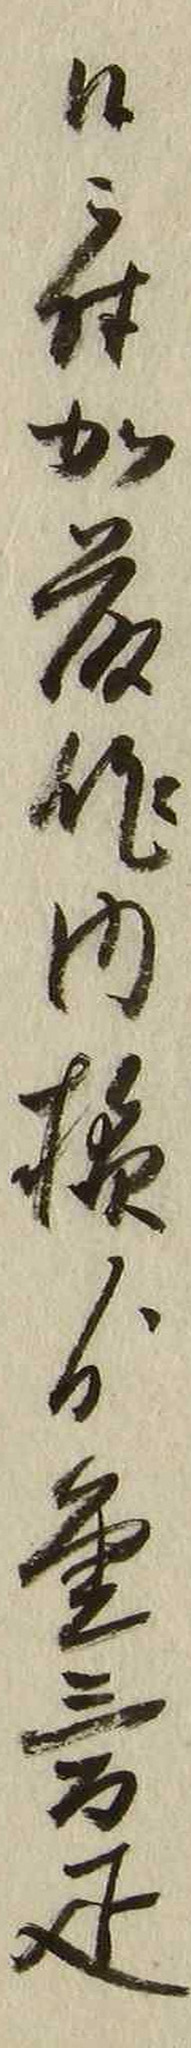候ニ付加藤作内様ゟ金三百疋
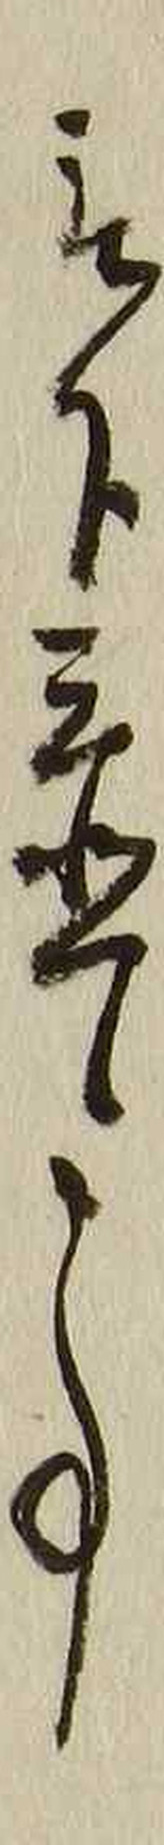被下置候事
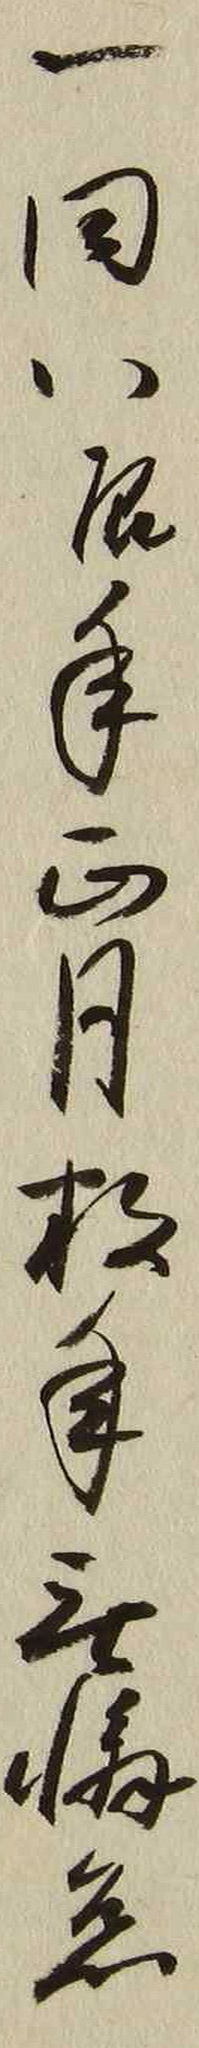一同八辰年正月数年無懈怠
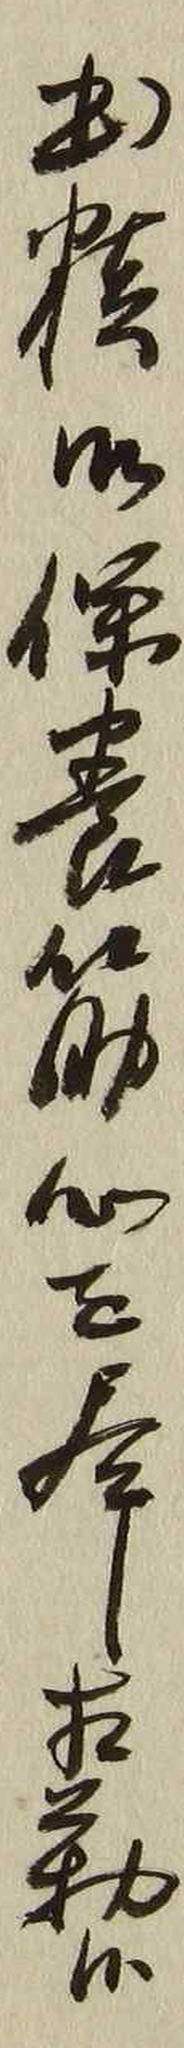出精御保養筋心を尽し相勤候
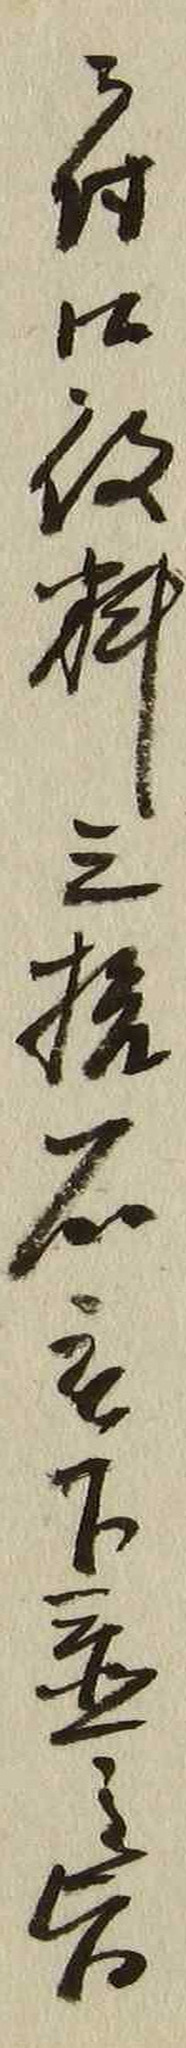ニ付御役料三拾石被下置之旨
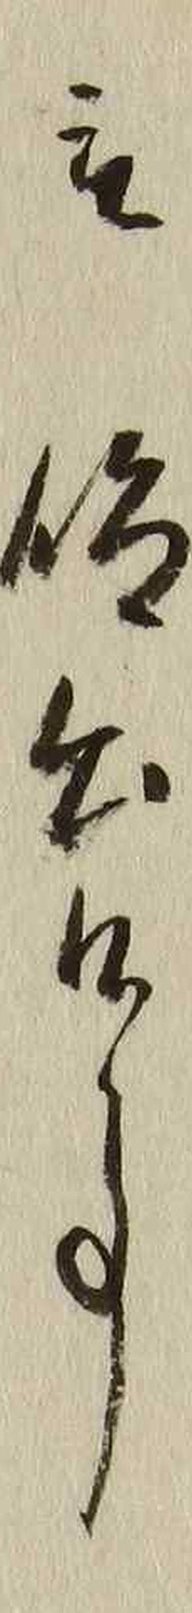被仰出候事
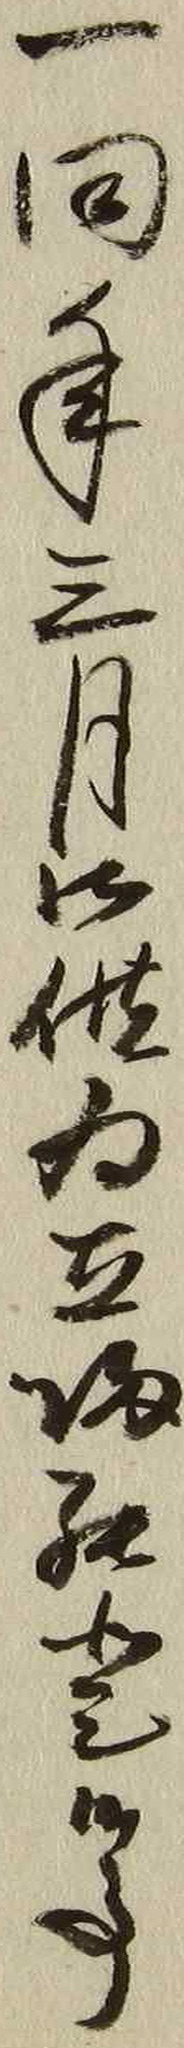一同年三月御供為立帰罷登候事
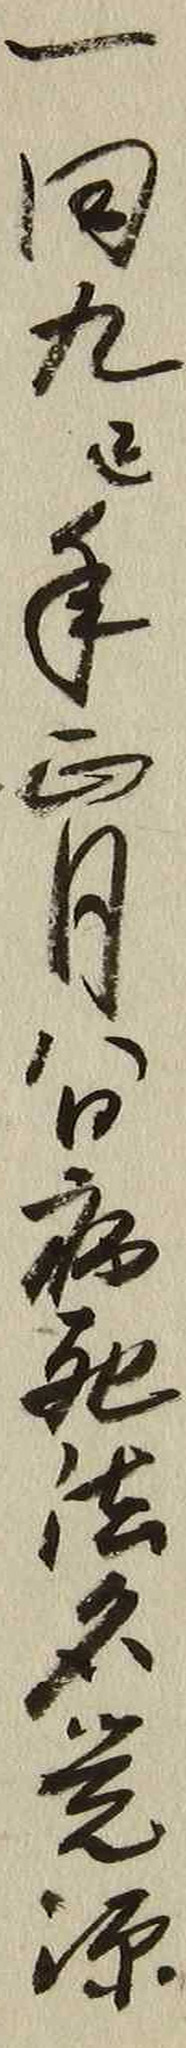一同九巳年正月八日病死法名覚深
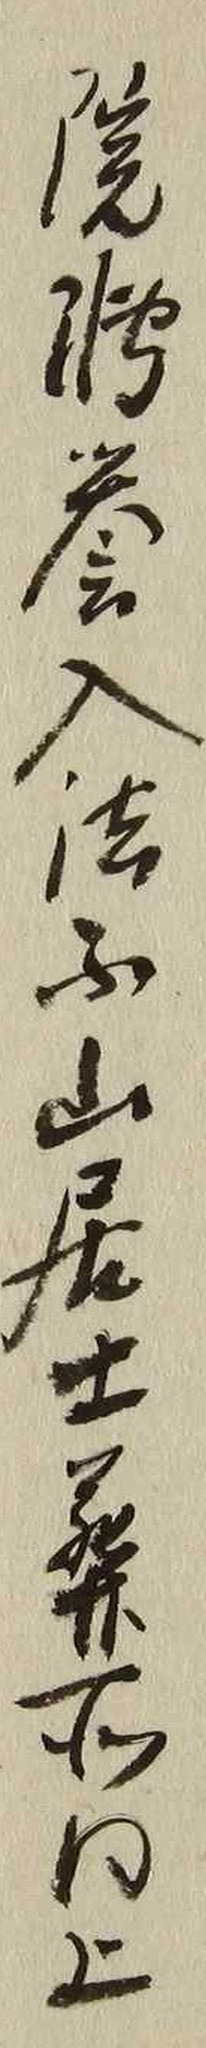院転誉入法不山居士葬所同上
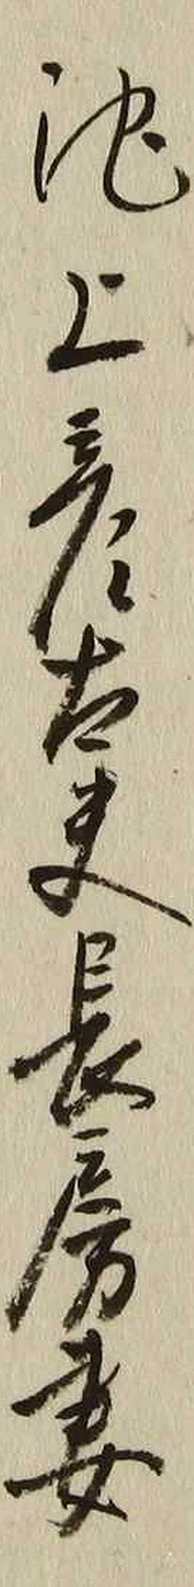女池上彦太夫長房妻
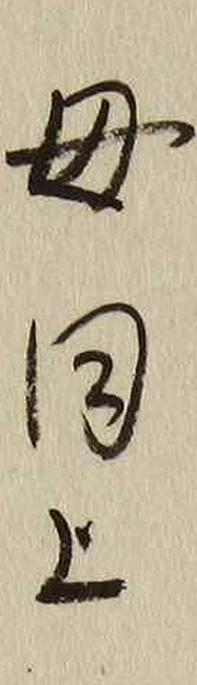母同上
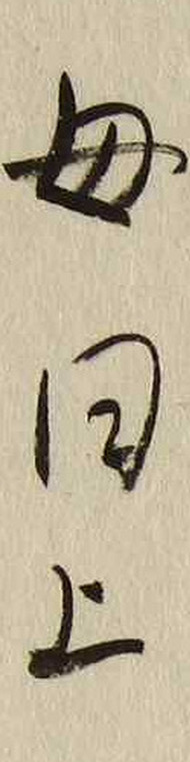母同上

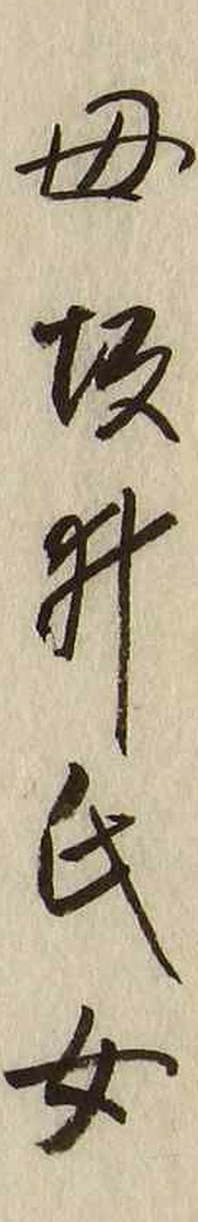母坂井氏女
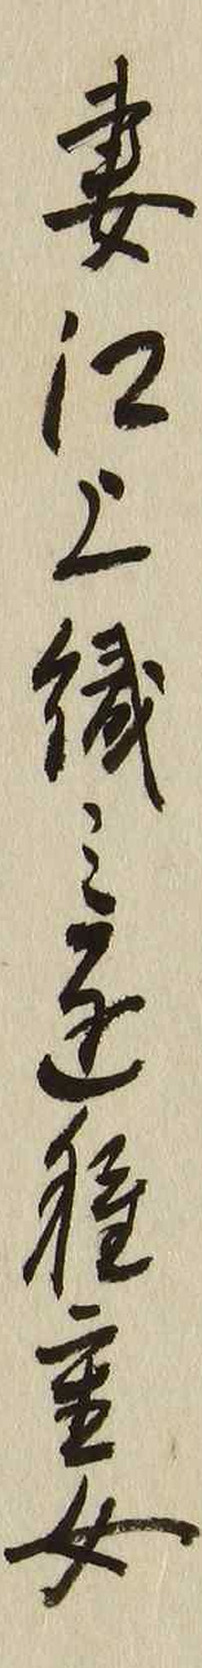妻江上織之進種重女
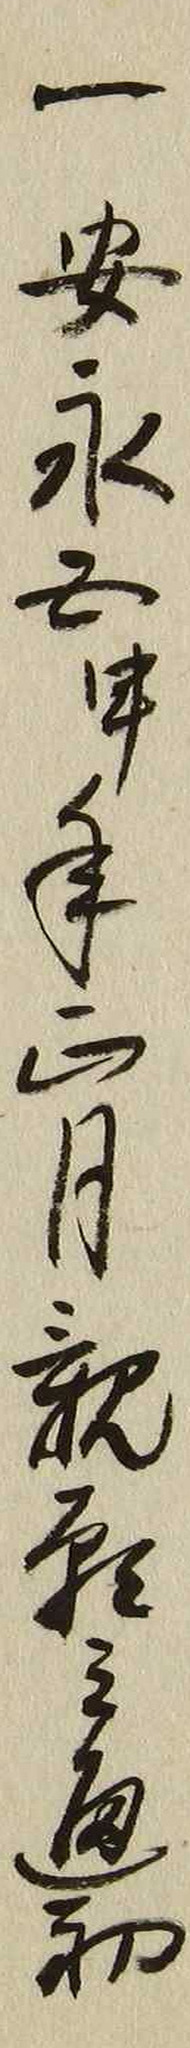一安永五申年正月親願之通初
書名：諸士系譜　巻之353　す之部3
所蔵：会津若松市立会津図書館
